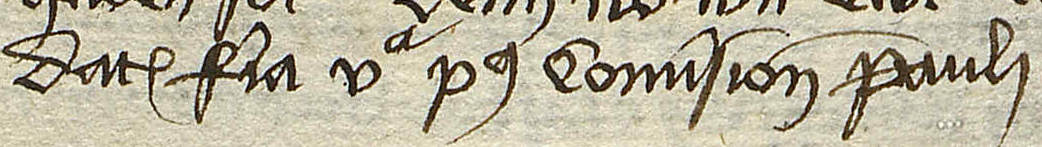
Dat* f*ia v* p* Conu*ſion* Pauli
